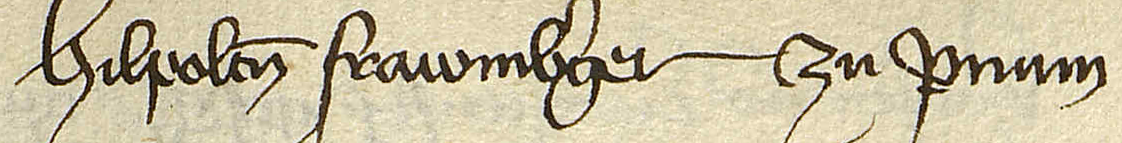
Hilpoltn* frawmb*ger cʒu Prunn
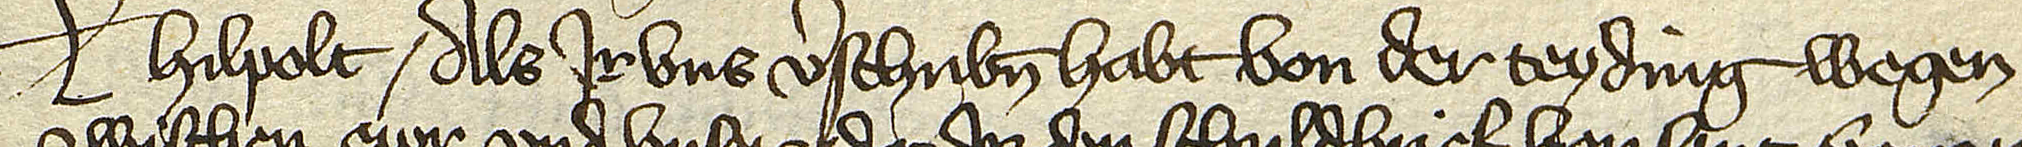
L* Hilpolt / Als Ir vns v*ſchribn* habt von der teyding wegen
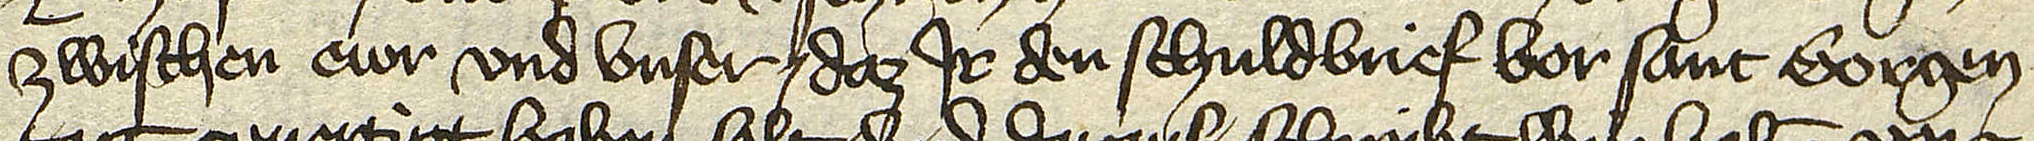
cʒwiſchen ewr vnd vnſer / daʒ Ir den ſchuldbrief vor ſant Gorgen
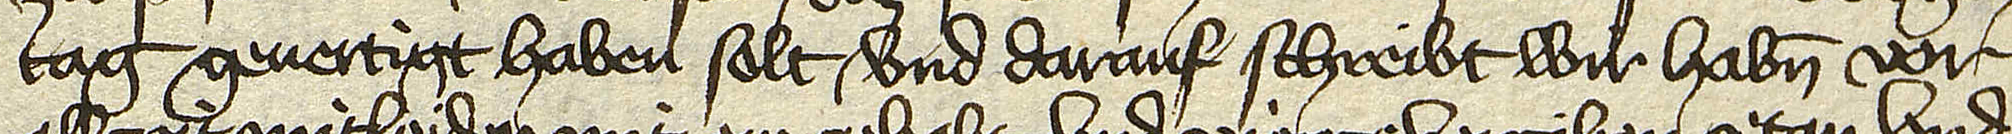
tag geuertigt haben ſolt / vnd darauf ſchreibt wir habn* vor
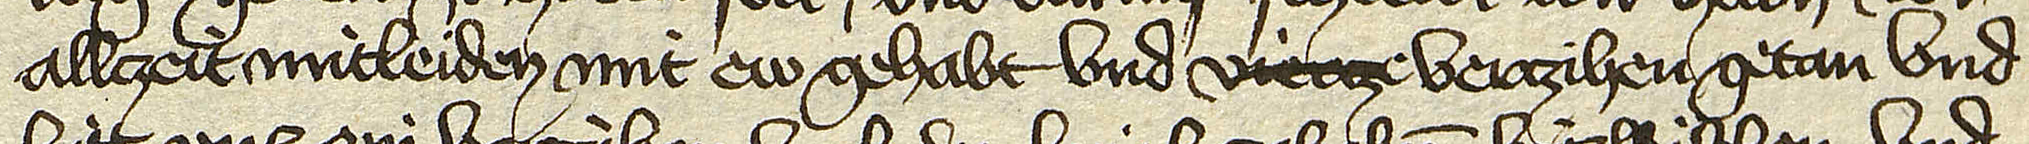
allcʒeit mitleiden mit ew gehabt vnd viercʒe vercʒihen getan vnd
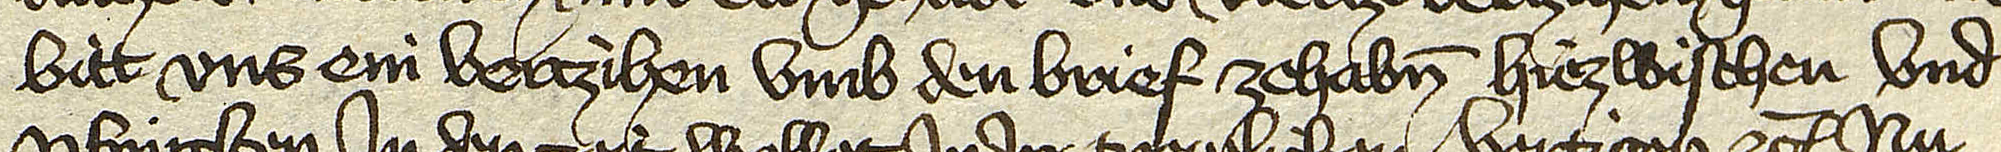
bat vns ein vercʒihen vmb den brief cʒehabn* hieʒwiſchen vnd
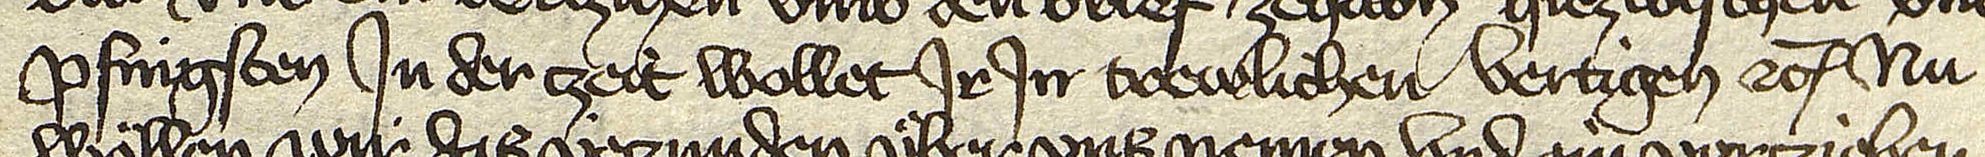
Pfingſten In der cʒeit wollet Ir In trewlichen / vertigen ec* Nu
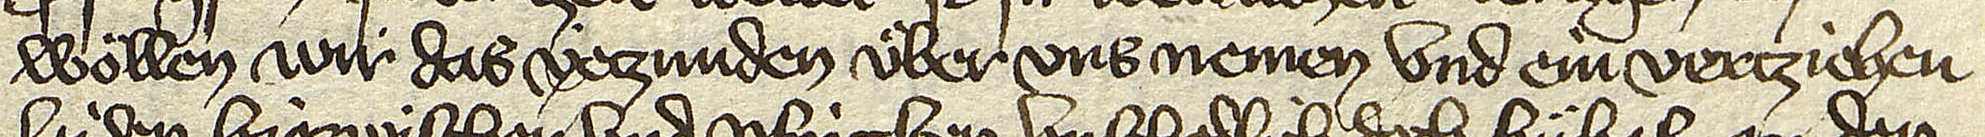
wöllen wir das yecʒunden v̈ber vnd nemen vnd ein vercʒiehen
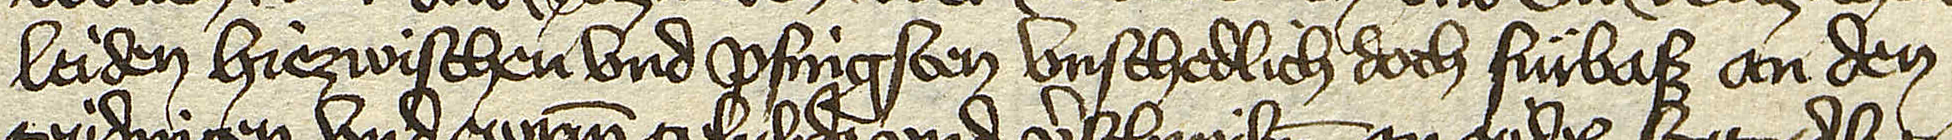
leiden hiecʒwiſchen vnd Pfingſten vnſchedlich doch fürbaſʒ an den
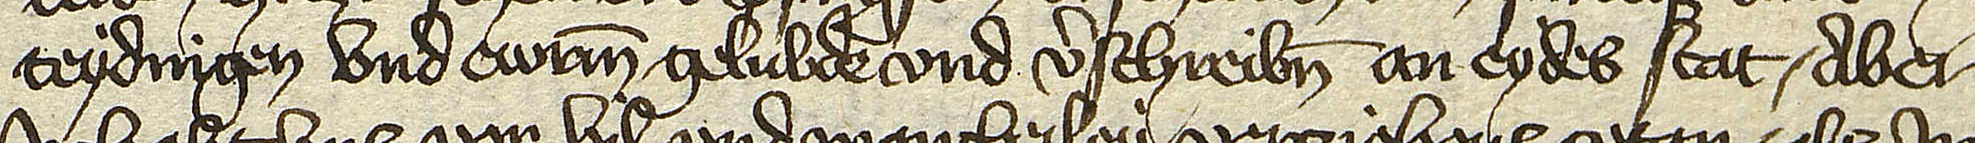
teydingen vnd ewrm* gelubde vnd v*ſchreibn* an eydes ſtat / Aber
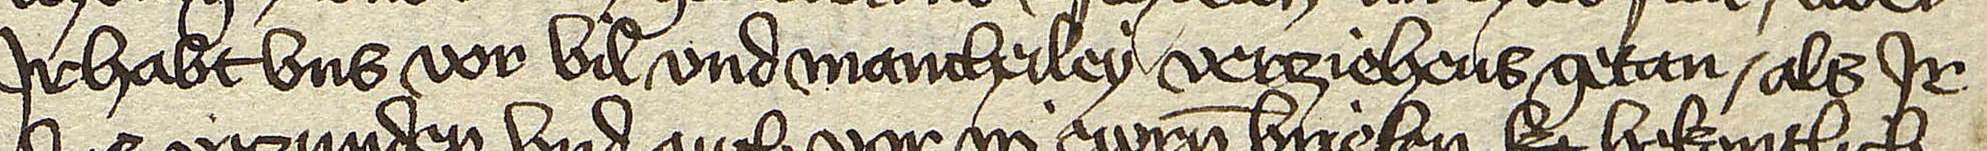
Ir habt vns vor vil vnd mancherley vercʒiehens getan / als Ir
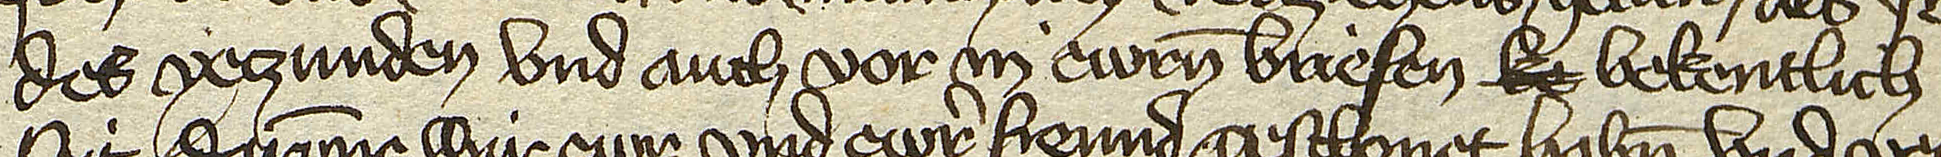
des yecʒunden vnd auch vor in ewrn* briefen ke bekentlich
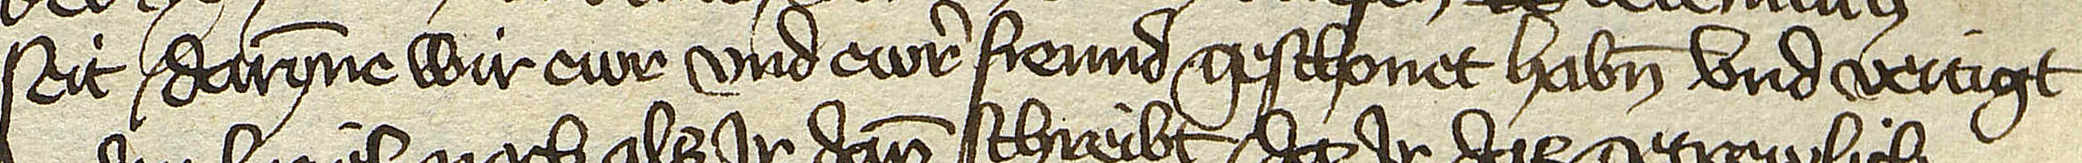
ſeit / daryne* wir ewr vnd ewr* freund geſchonet habn* vnd vertigt
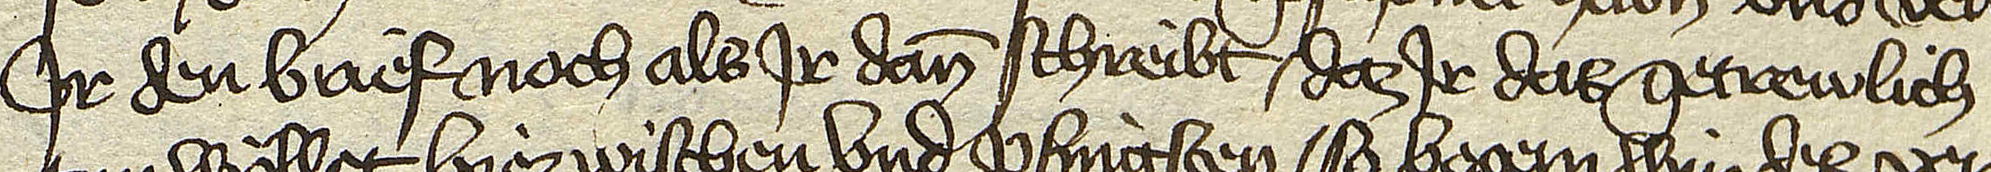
Ir den brief noch als Ir dan* ſchreibt / daʒ Ir das getrewlich
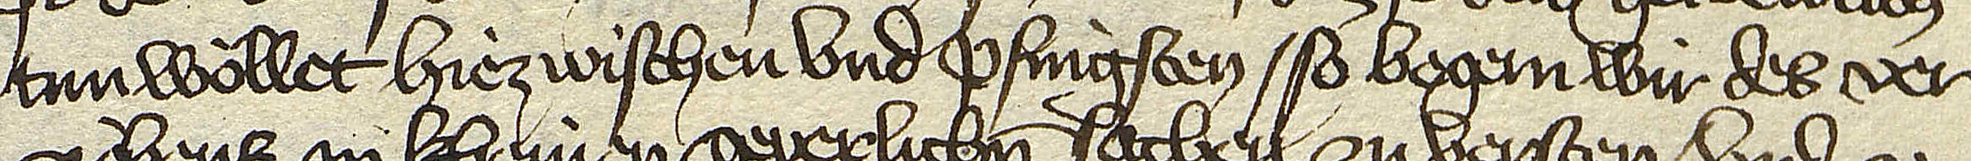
tun wöllet hiecʒwiſchen vnd Pfingſten / ſo begern wir des ver
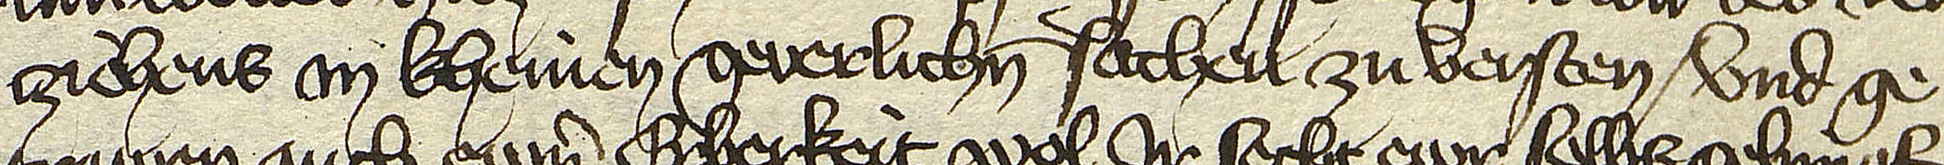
cʒichens in kheinen geverlichn* ſachen cʒu verſten / vnd ge
